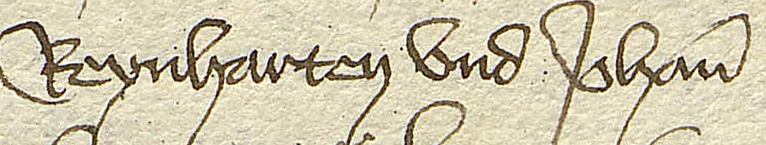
Reynharten vnd Iohan*
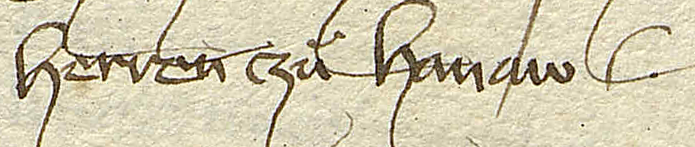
herren cʒü hanau / .
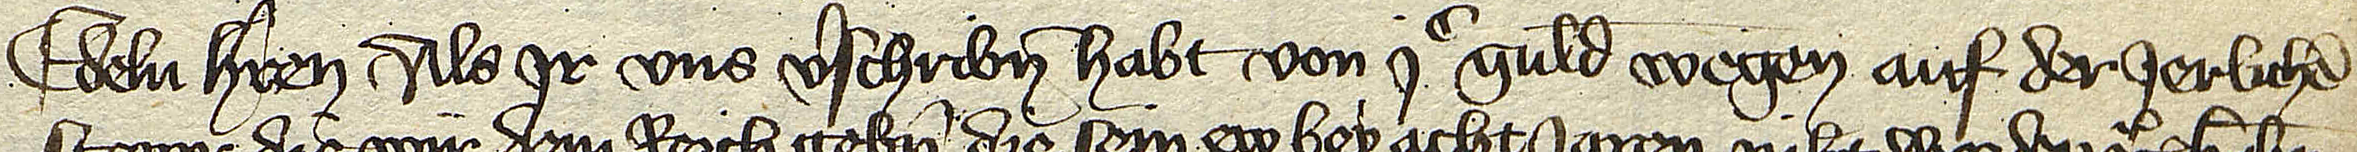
Edeln h*ren / Als Ir vns v*ſchribn* habt von i* guld* wegen auf der Ierliche*
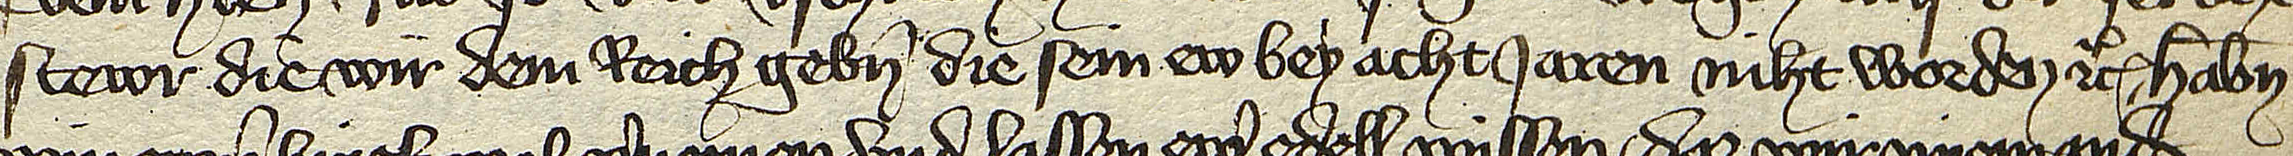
ſtewr die wir dem Reich gebn* die ſein ew bey acht Iaren niht worden ec* / habn*
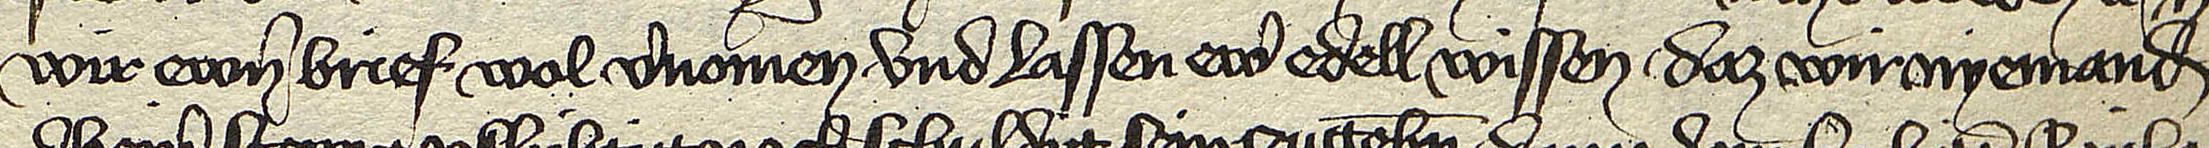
wir ewn* brief wol v*nomen / vnd laſſen ew* edell wiſſen / daʒ wir nyemand*
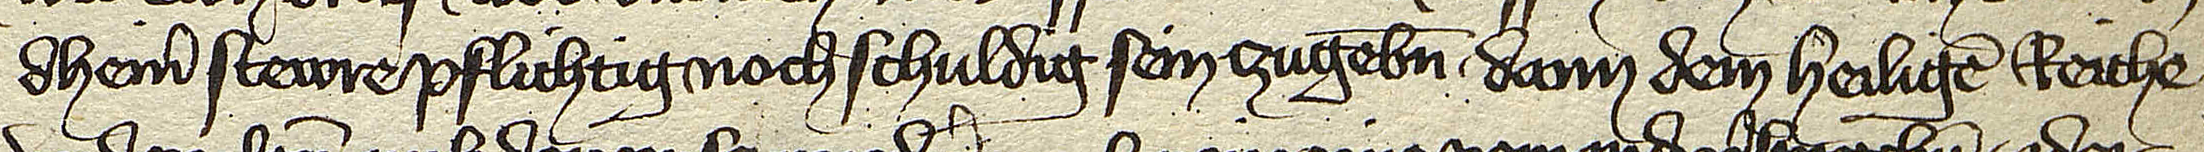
dheim* ſtewre pflichtig noch ſchuldig ſein cʒugebn* / dann dem heilige* Reiche
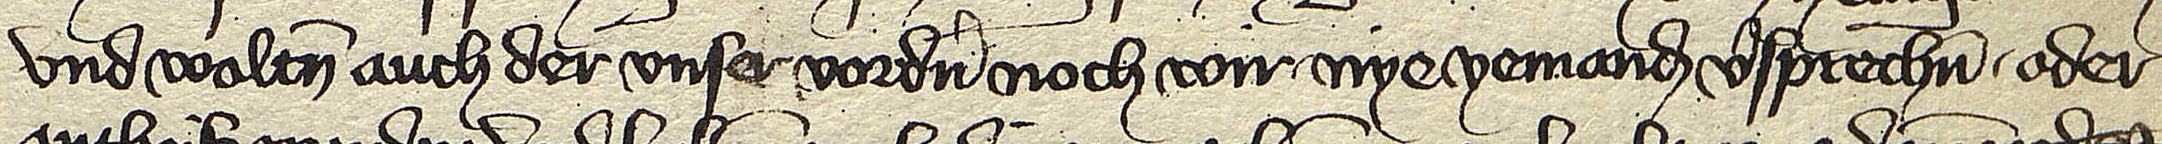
vnd woltn* auch der vnſer vordn* noch wir nye yemand* v*ſprechn* / oder
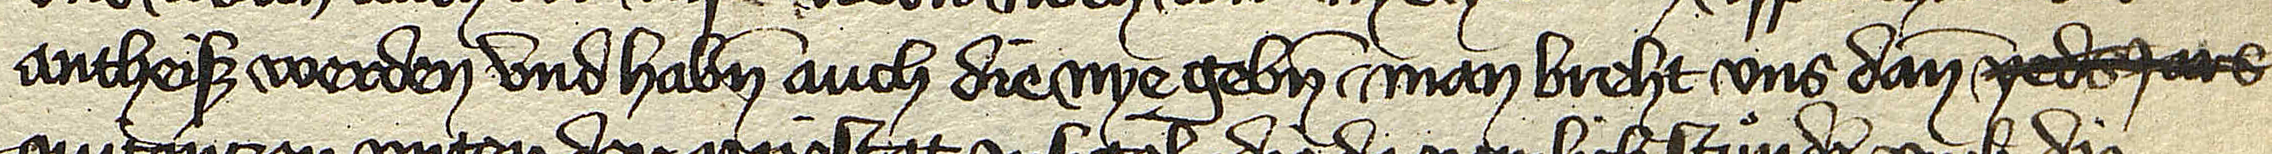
antheiſʒ werden vnd habn* auch die nye gebn* / man breht vns dan* yeds Iars
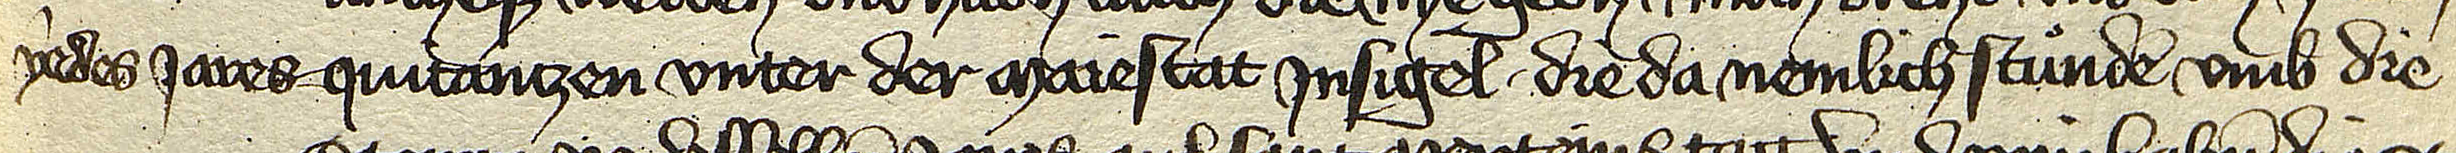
yedes Iares quitancʒen vnter der Maieſtat Inſigel / die da nemlich ſtünde vmb die
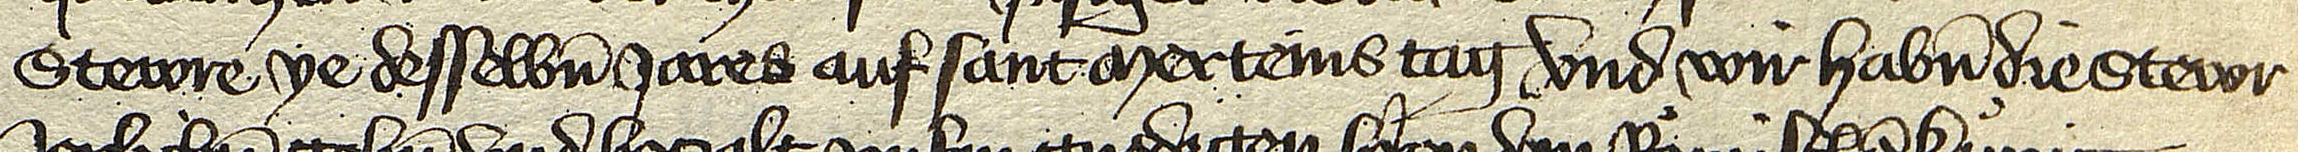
Stewre ye deſſelbn* Iares auf ſant Merteins tag / vnd wir habn* die Stewr
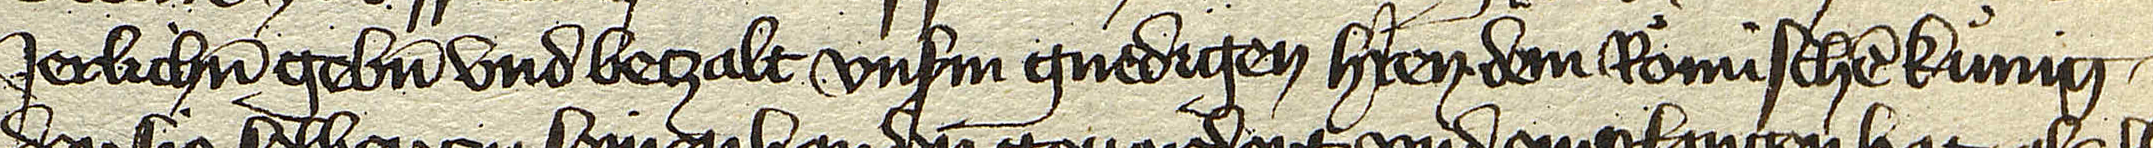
Ierlichn* gebn* vnd becʒalt vnſ*m gnedigen h*ren ~ dem Römiſche* künig /
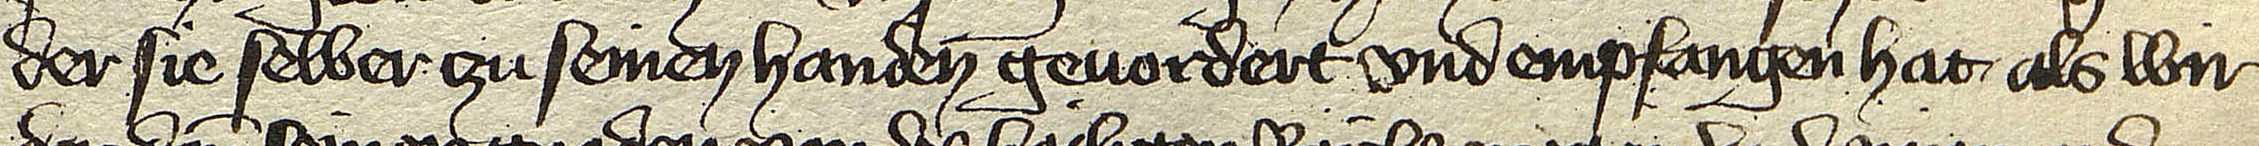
der ſie ſelber cʒu ſeinen handen geuordert vnd empfangen hat / als wir
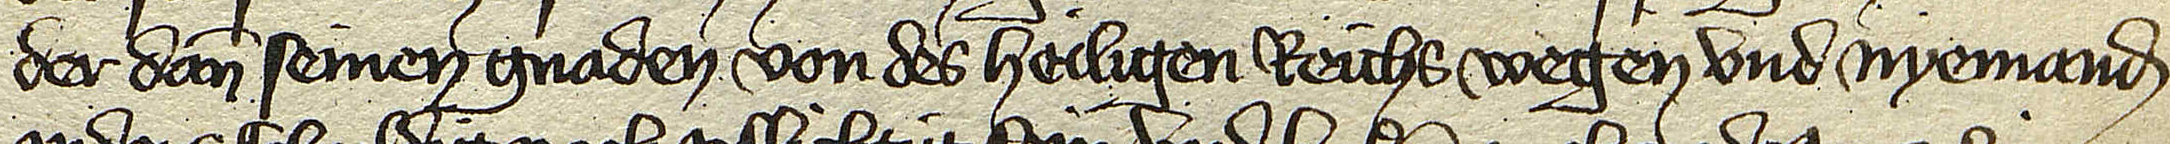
der dan* ſeinen gnaden von des heiligen Reichs wegen vnd nyemand*
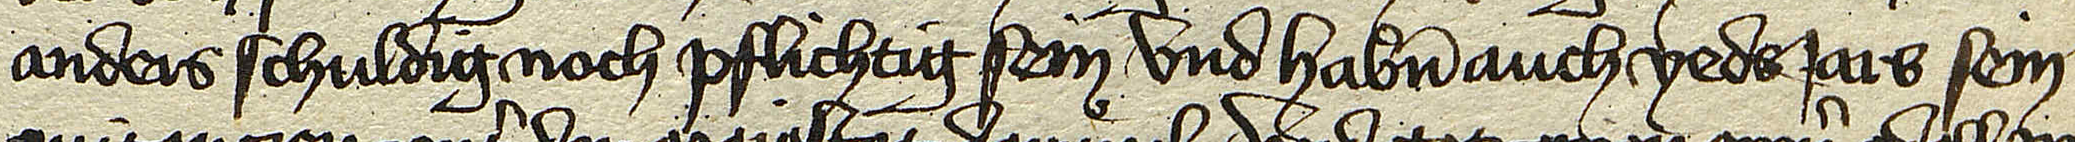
anders ſchuldig noch pflichtig ſein / vnd habn* auch yeds Iars ſein
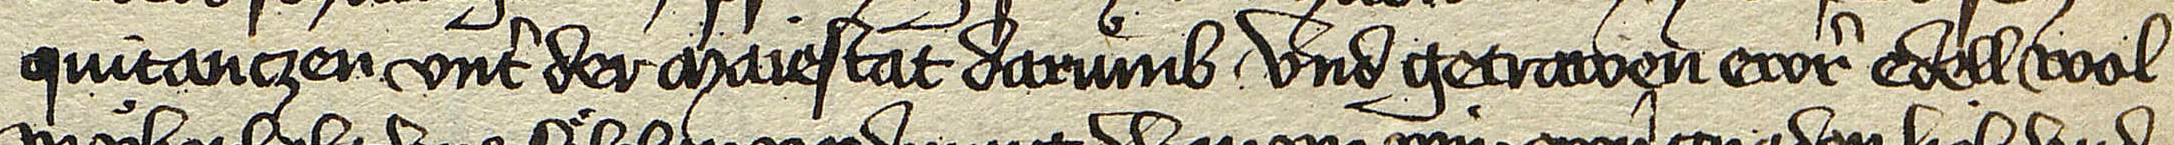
quintancʒen vnt* der Maieſtat darümb / vnd getrawen ewr* edell wol
